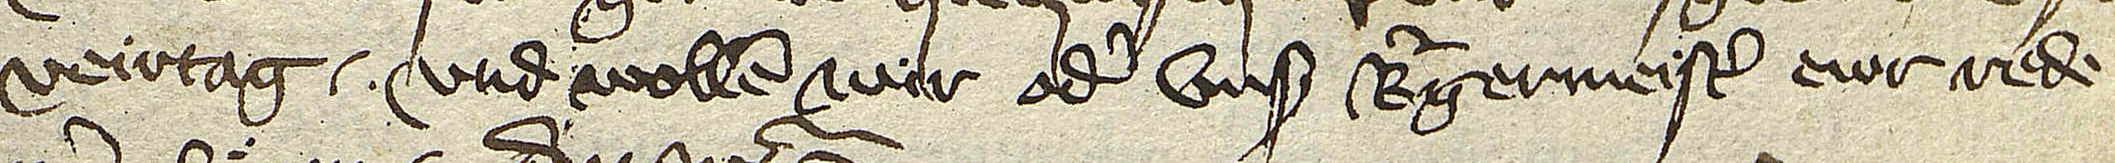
veirtag /. vnd wolle* wir od* vnſ* B*germeiſt* ewr rede
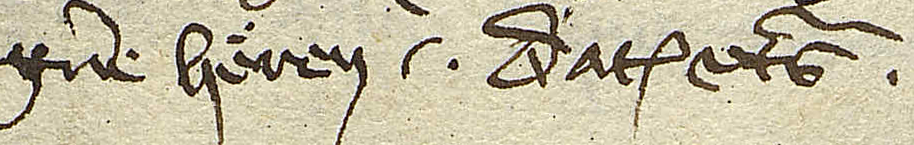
gn*e hören / . Dat* vts* .
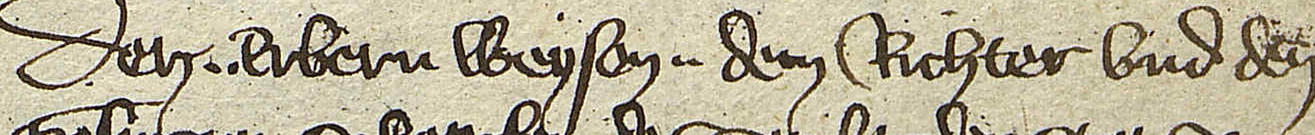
Den ~ Erbern weyſen ~ dem Richter vnd den
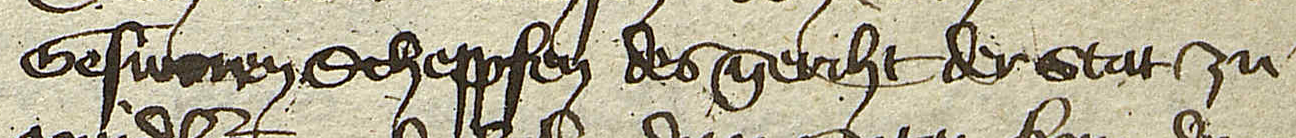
Geſworen Scheppfen des gericht der Stat cʒu
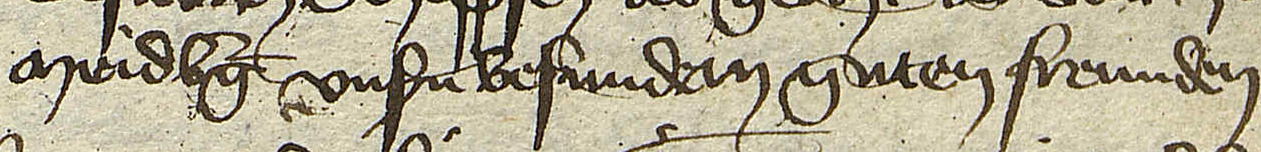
Meidbg* vnſ*n beſundern guten freunden
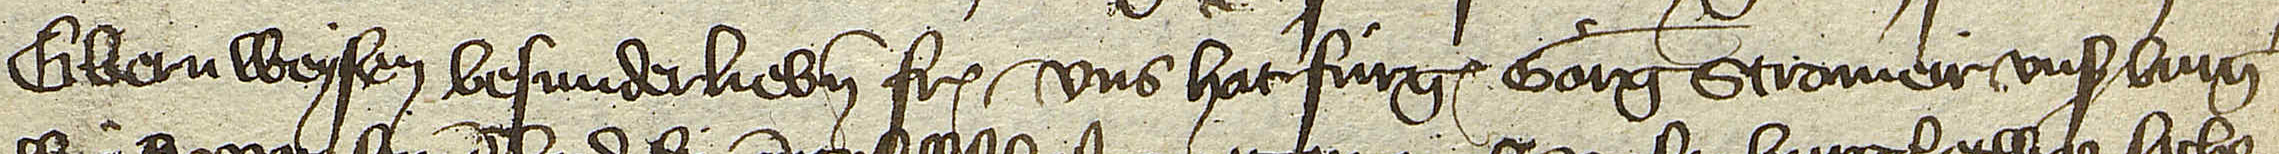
Erbern weiſen beſunder liebn* fr* / vns hat fürg* Görg Stromeir vnſ* burg*
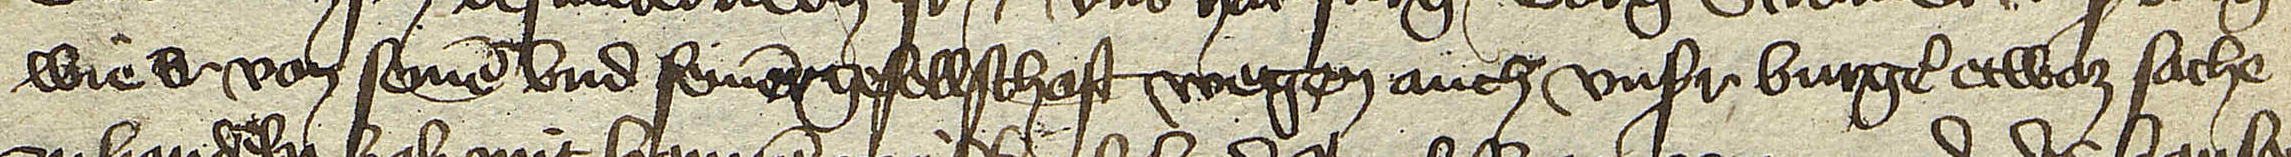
wie Er von ſeine* vnd ſeiner* geſellſchaft wegen auch vnſ*r burge* etwaʒ ſache
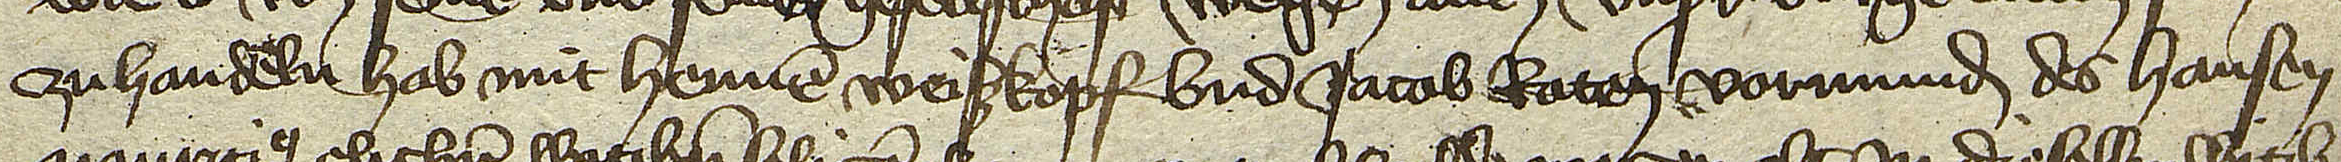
cʒu handeln hab mit henne* weiſʒkopf vnd Iacob Raten vormund* des hanſen
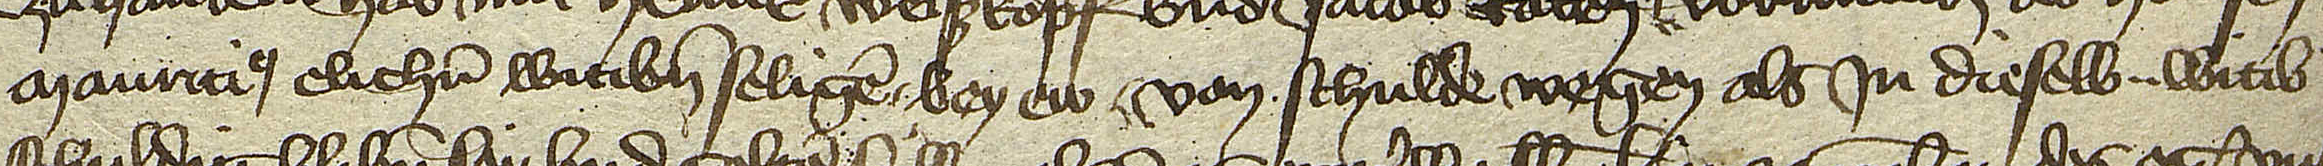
Maurici* elichn* witibn* ſelige* / bey ew von ſchulde wegen als In dieſelb ~ witib
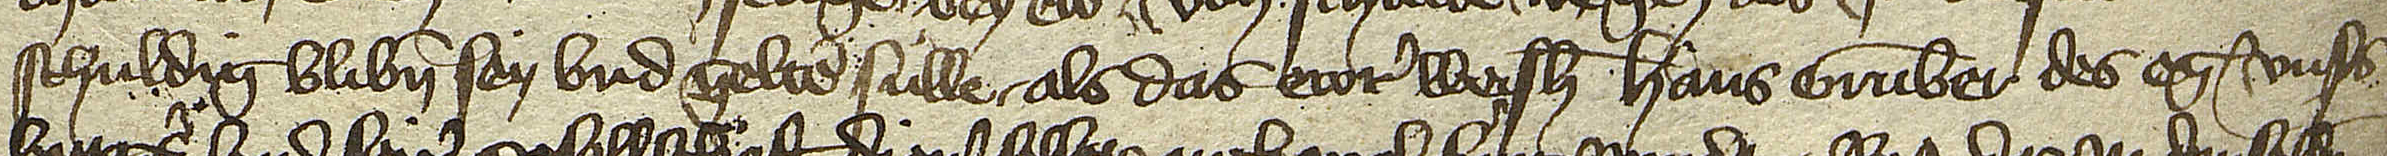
ſchuldig blibn* ſey vnd gelte* ſülle / als das ewr* weiſh* hans Gruber des eg* vnſ*s
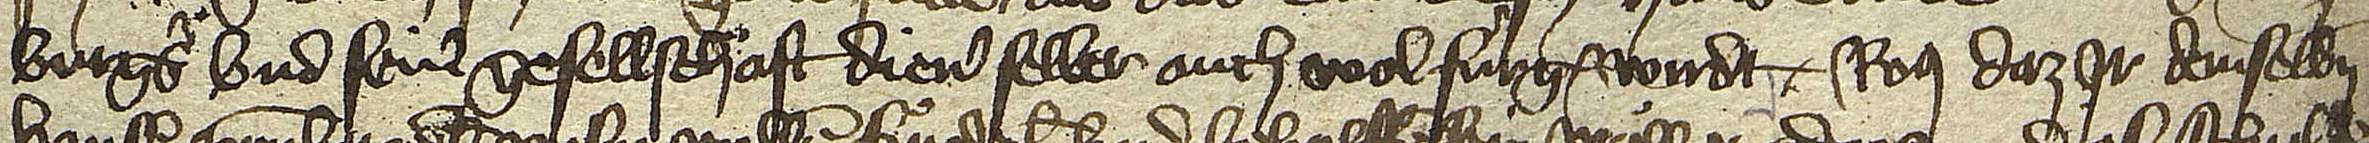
burgs* vnd ſeine* geſellſchaft dien* ſelber auch wol fürg* wirdt / Ro* daʒ Ir demſelbn*
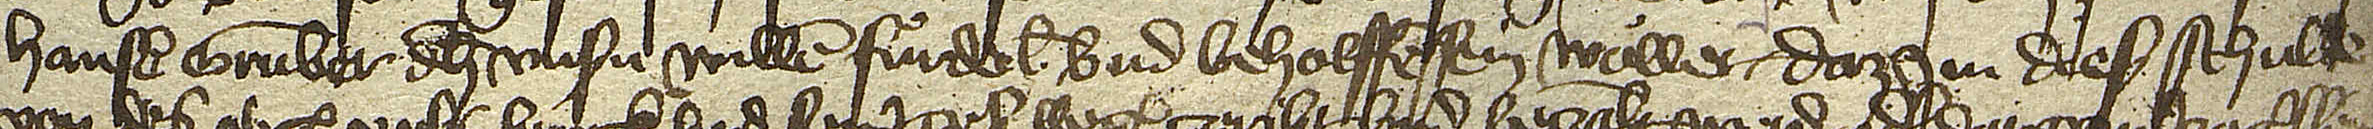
hanſe* Gruber d*h vnſ*n wille* fürderl* vnd beholffe* ſein wöllet / daʒ Im dieſ* ſchulde
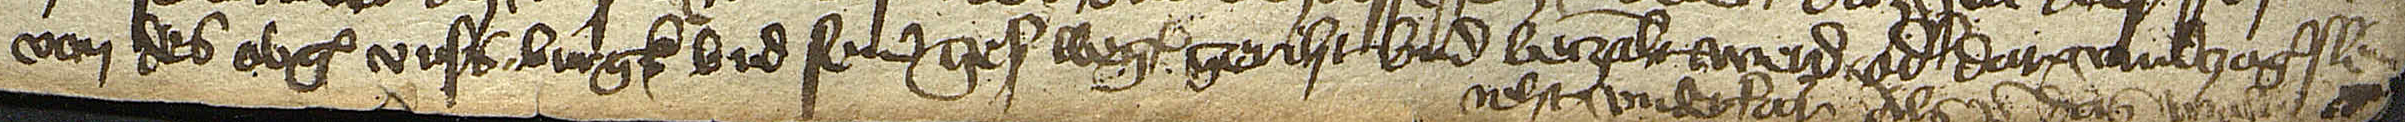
von des obg* vnſ*s burg*s vnd ſeine* geſ* weg* geriht vnd becʒalt* werd / od* dar* vnu*cʒog* ſlew
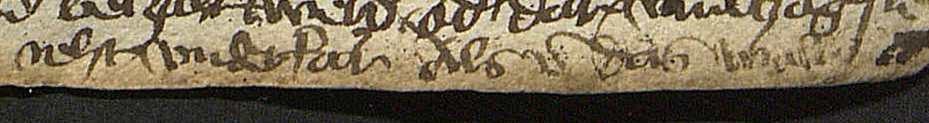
reht vnderfar Als ec* das wolle* ec*
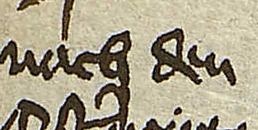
nach den
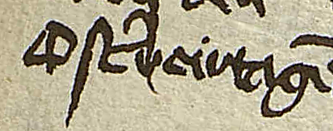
Oſt*veirtage*
